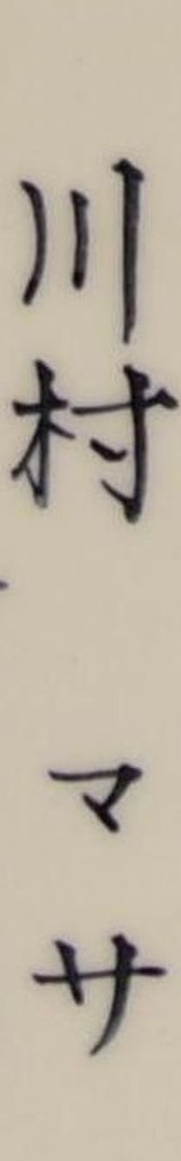川村マサ
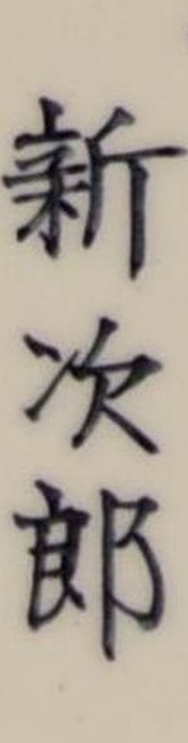新次郎
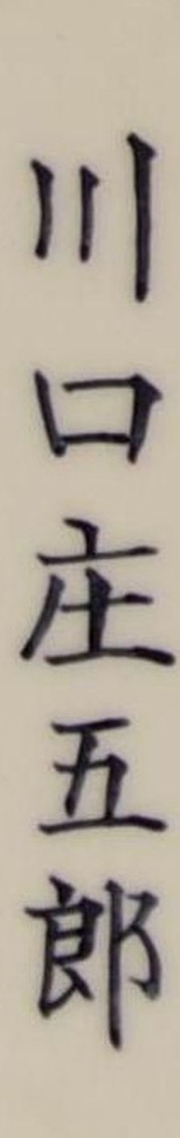川口庄五郎
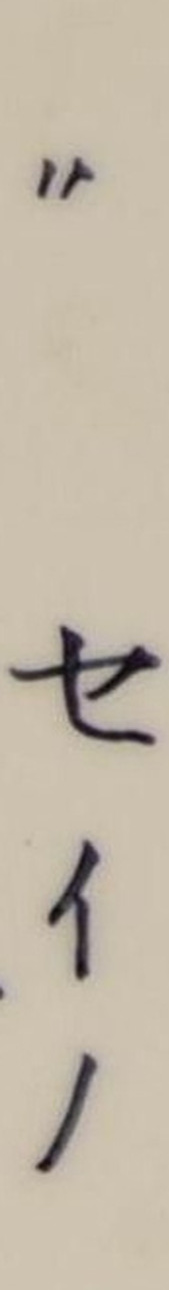セイノ
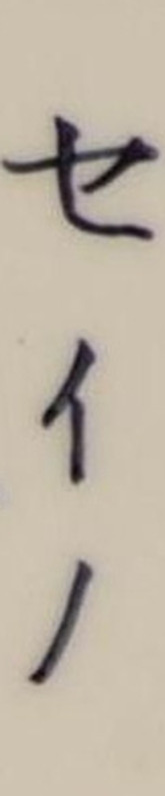セイノ
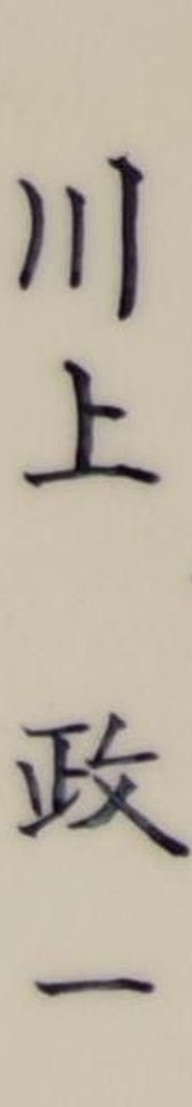川上政一
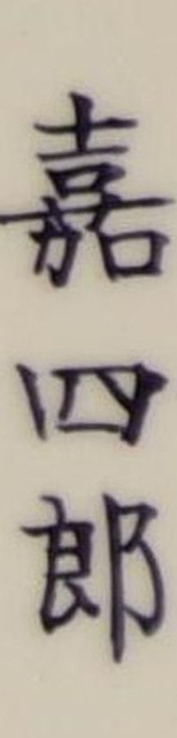嘉四郎

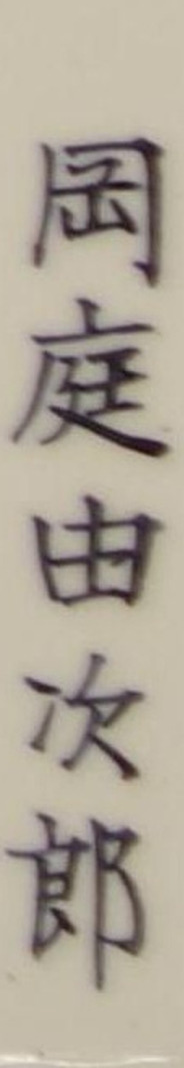岡庭由次郎
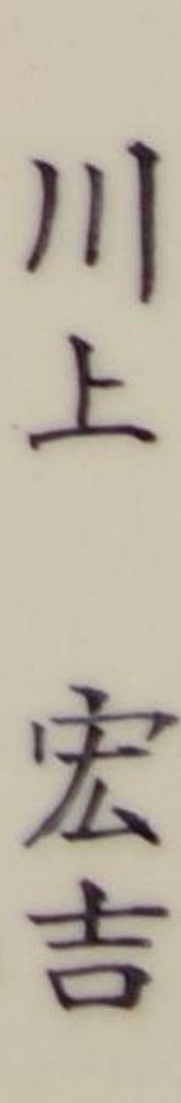川上宏吉
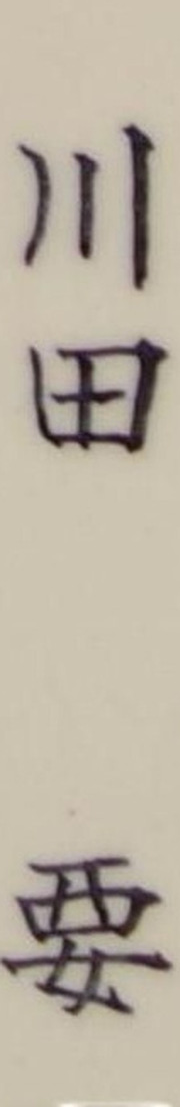川田要
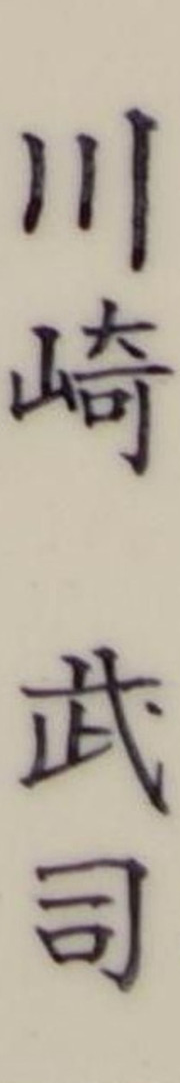川崎武司
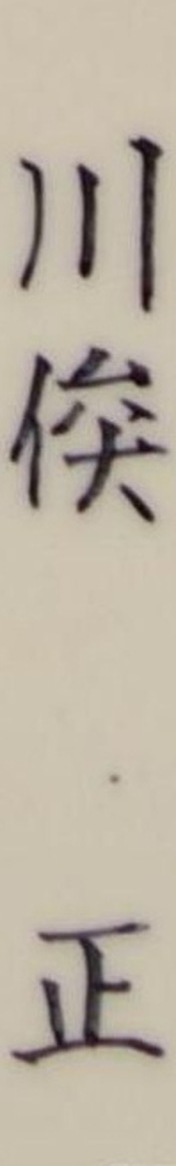川㑨正
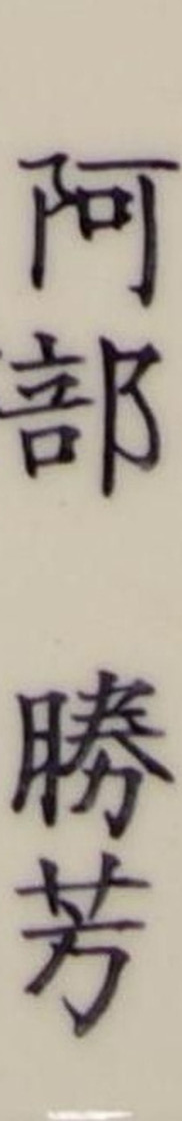阿部勝芳
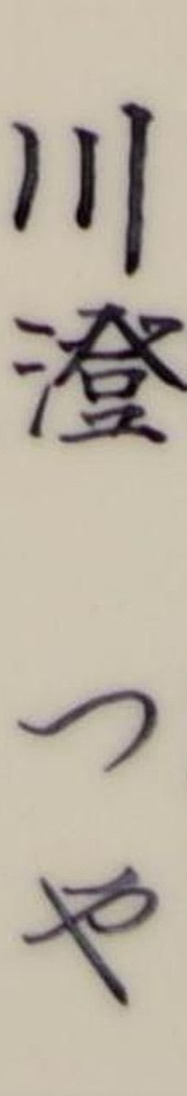川澄つや
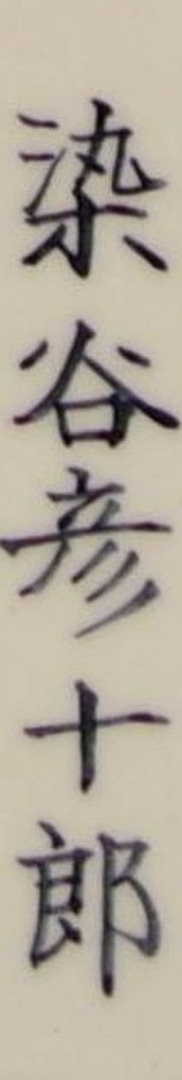染谷彦十郎
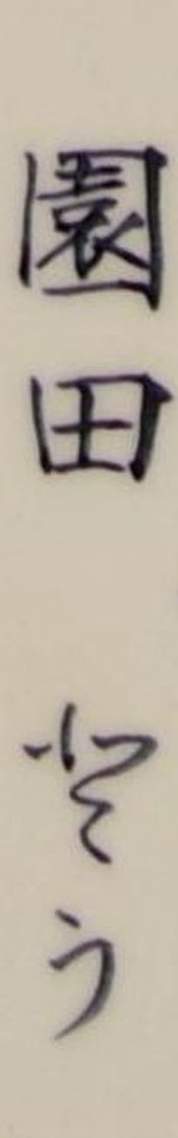園田とう
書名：E~L
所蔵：高野山金剛峯寺
